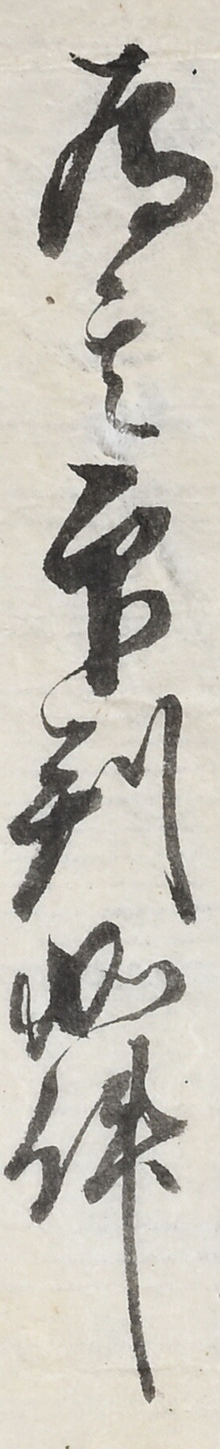為其印判如件
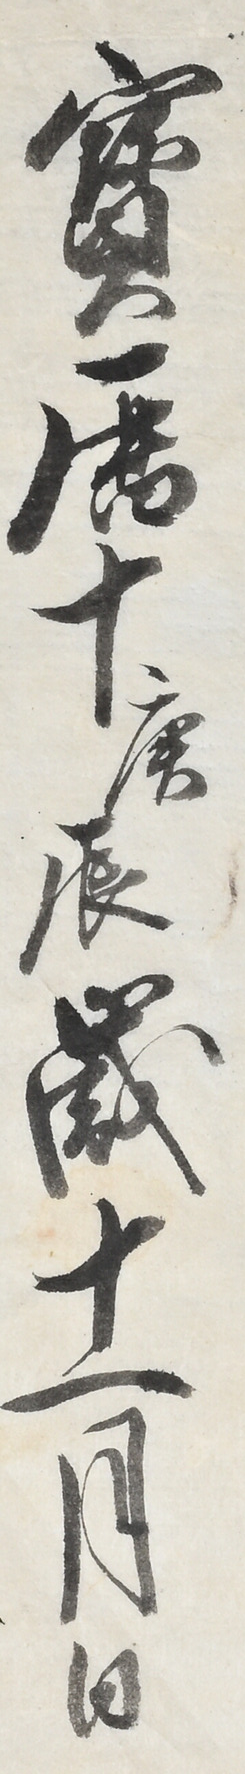宝暦十庚辰歳十一月日

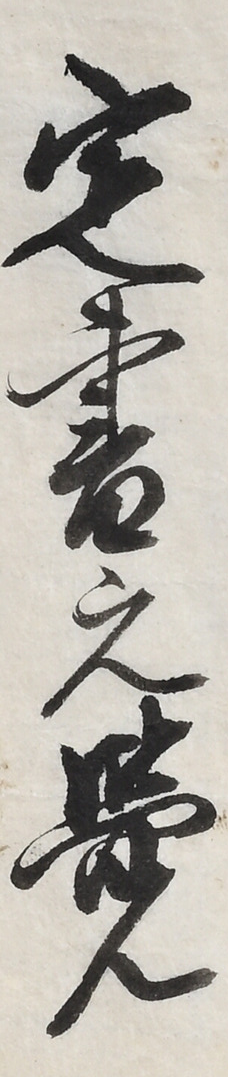定書之覚
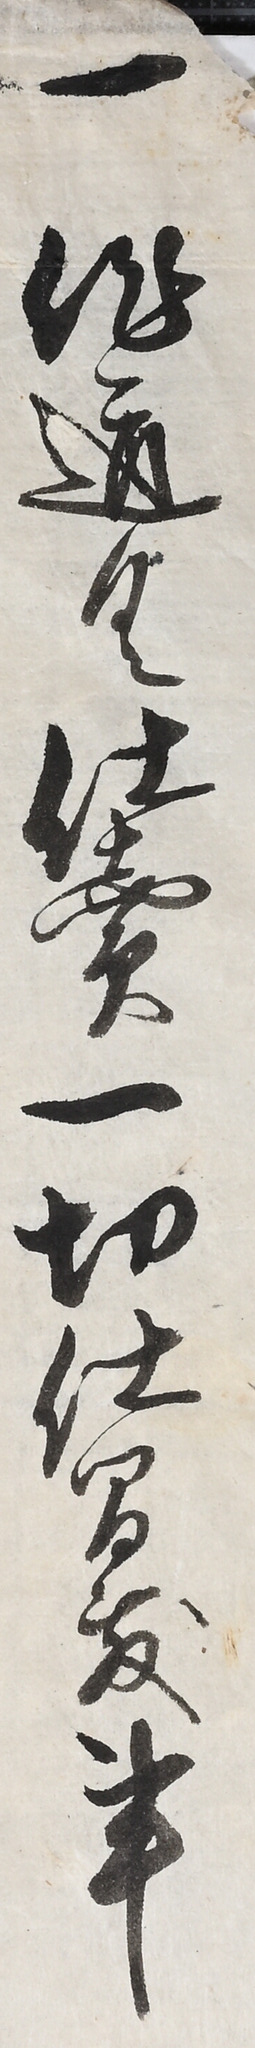一作道具仕売一切仕間敷事
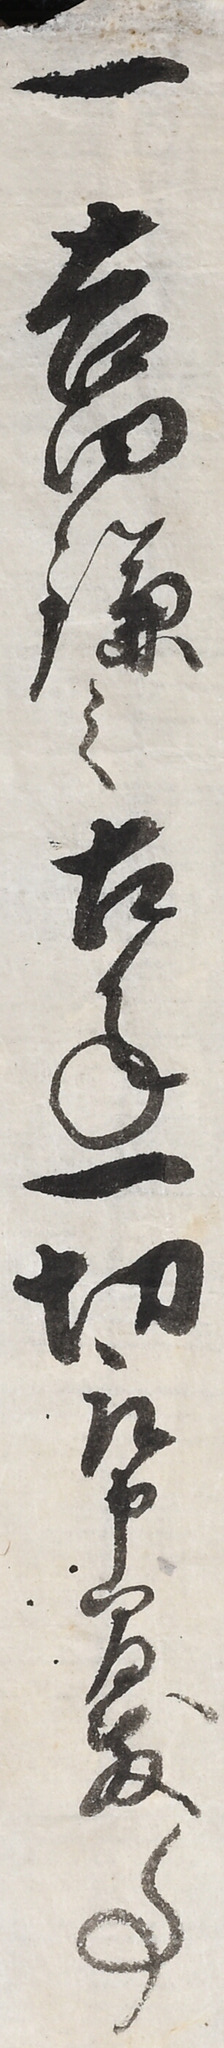一吉田鎌之古手一切取申間敷事
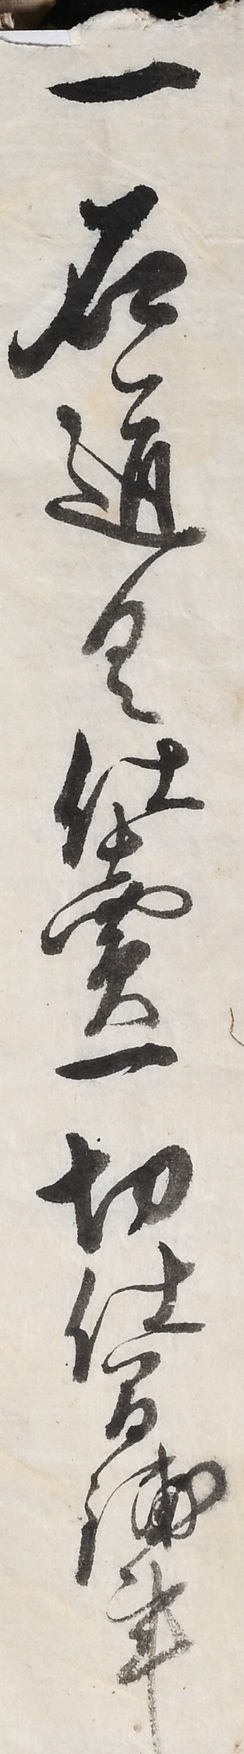一石道具仕売一切仕間敷事
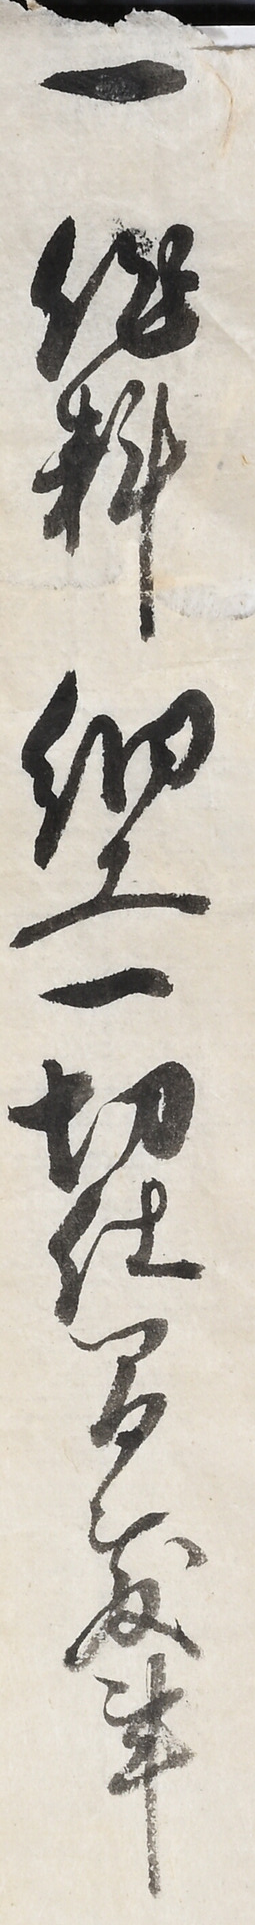一作料細工一切仕間敷事
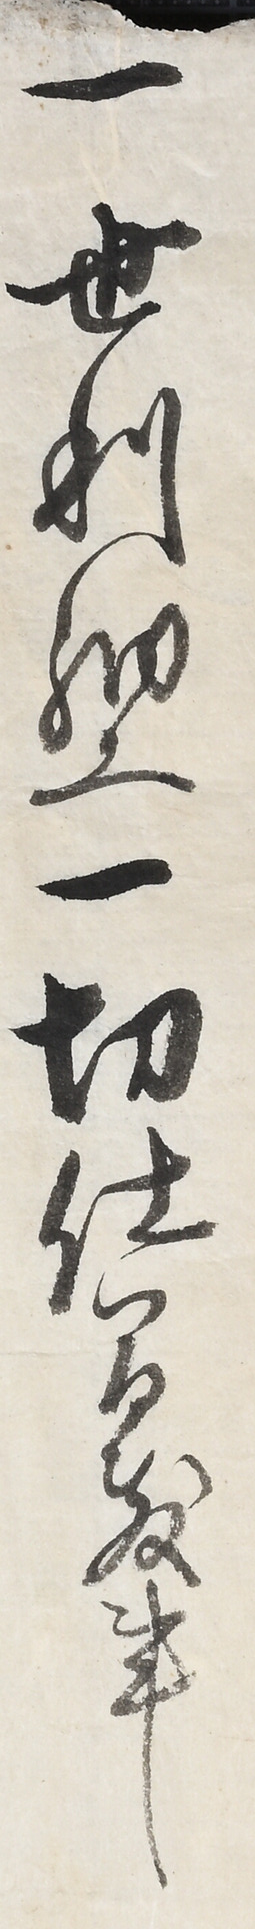一作料細工一切仕間敷事
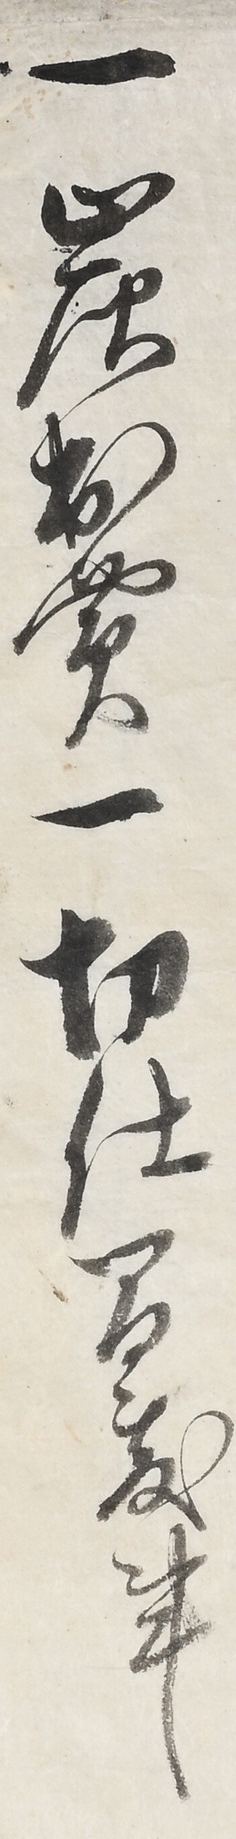一炭出買一切仕間敷事
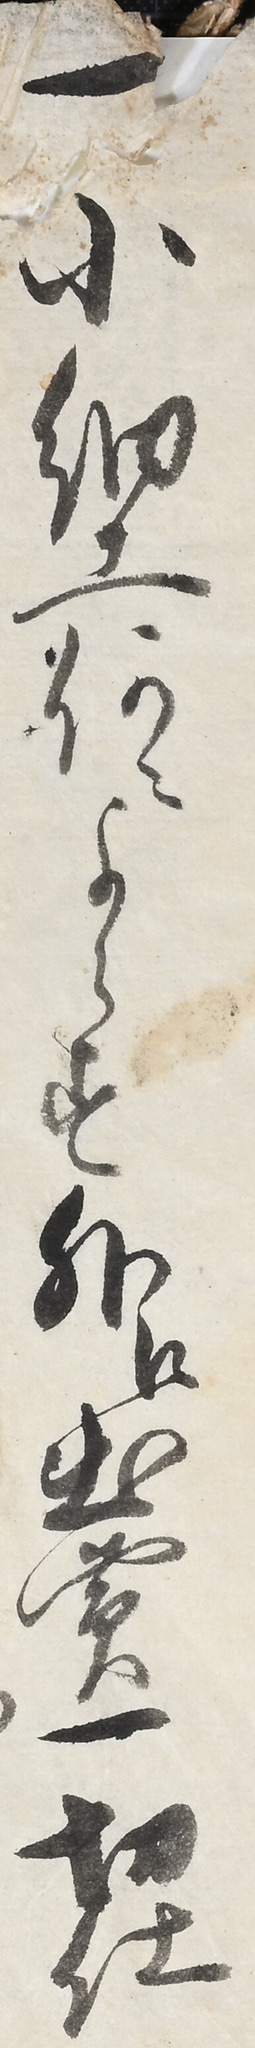一小細工何ニよらす外江出買一切仕
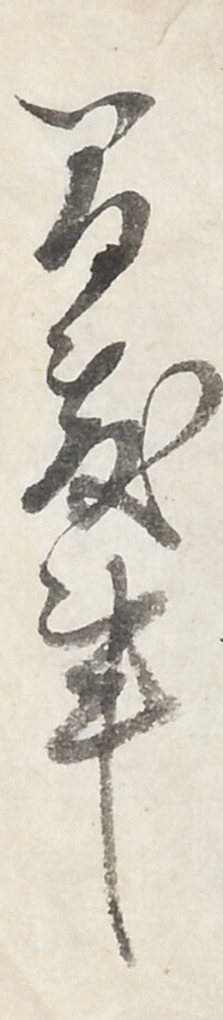間敷事

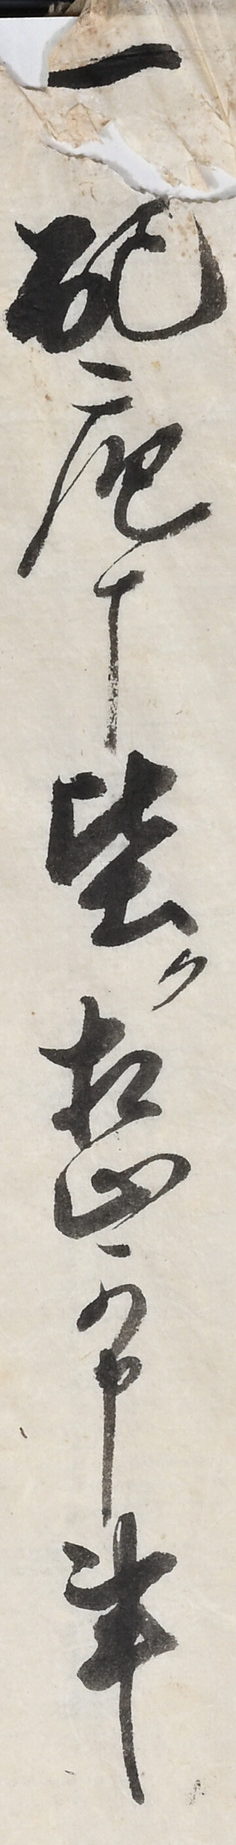一配包丁堅ク相止可申事
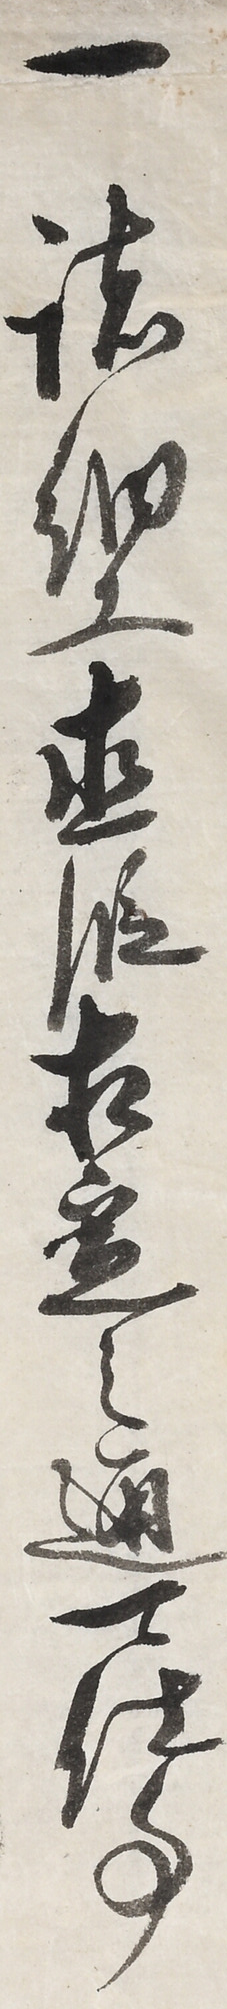一諸細工直段相定之通可仕事
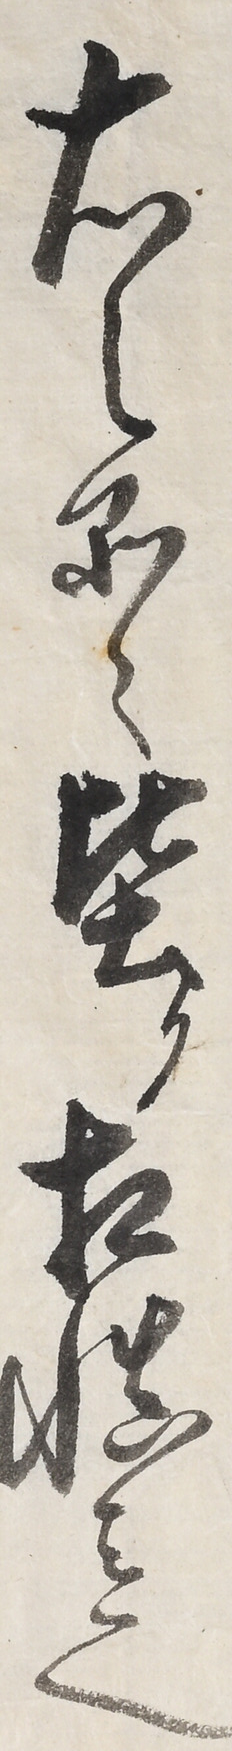右之品々堅ク相慎ミ也
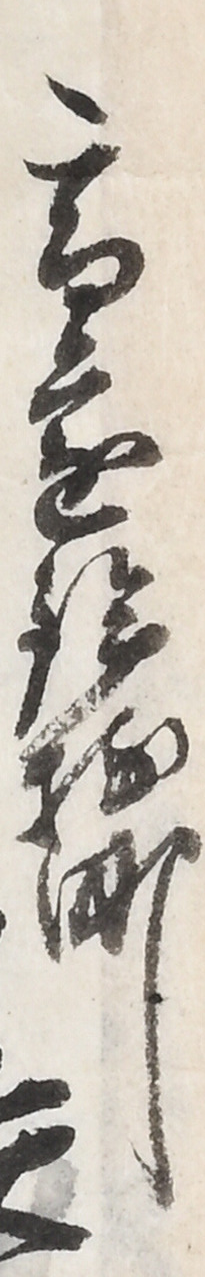高遠鉾持町

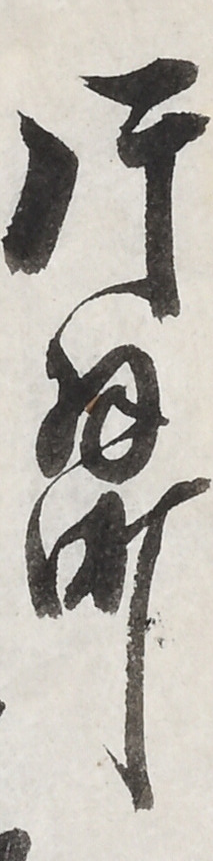片羽町
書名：高遠御領分鍛冶相定帳
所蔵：伊那市立高遠町図書館・合同会社AMANE
